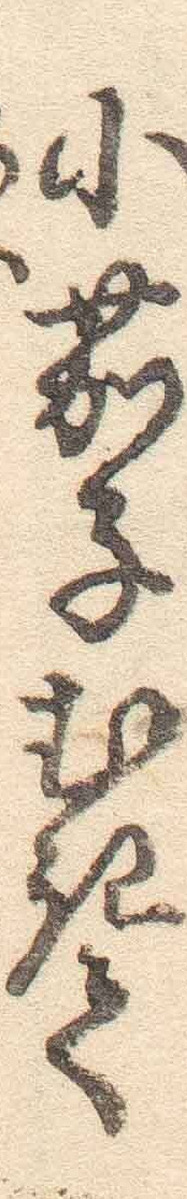小茄子むきて
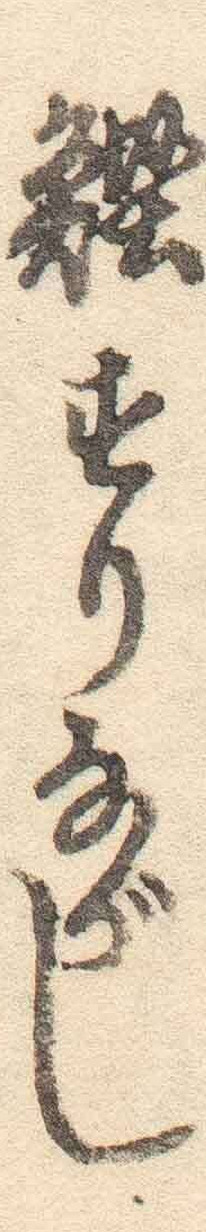鰹すりながし
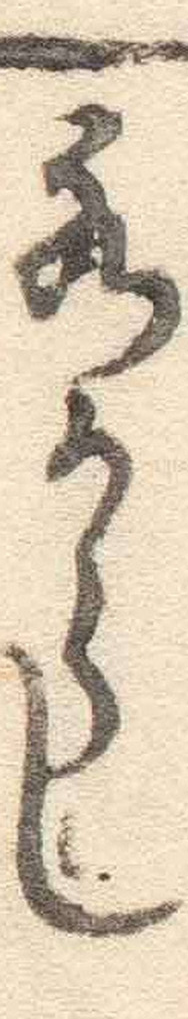水からし
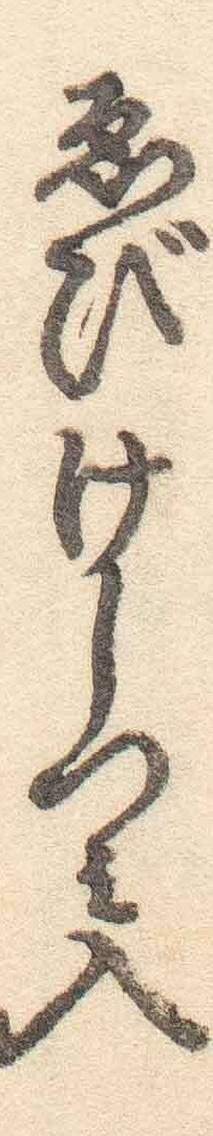ゑびけしつみ入
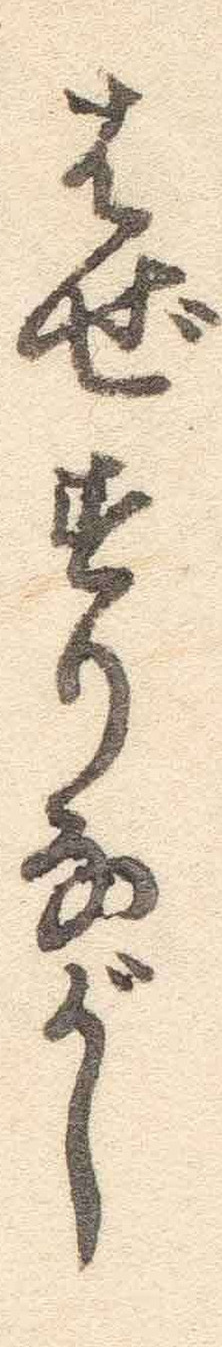鰹すりながし
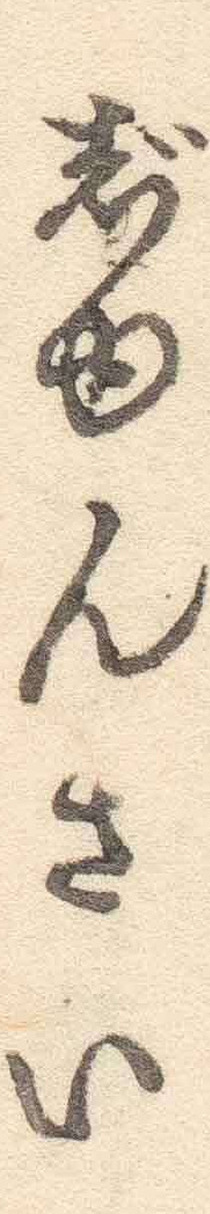じゆんさい
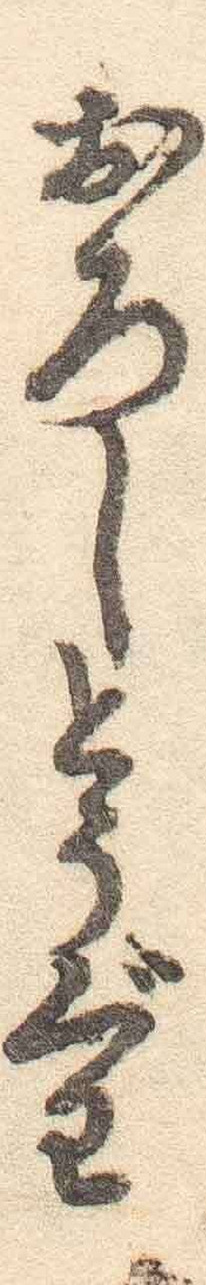おろしとうぐわ
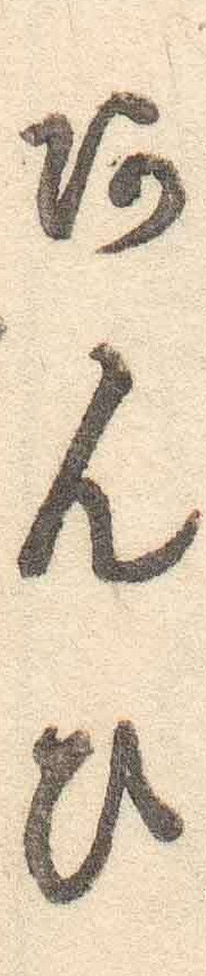あんひ
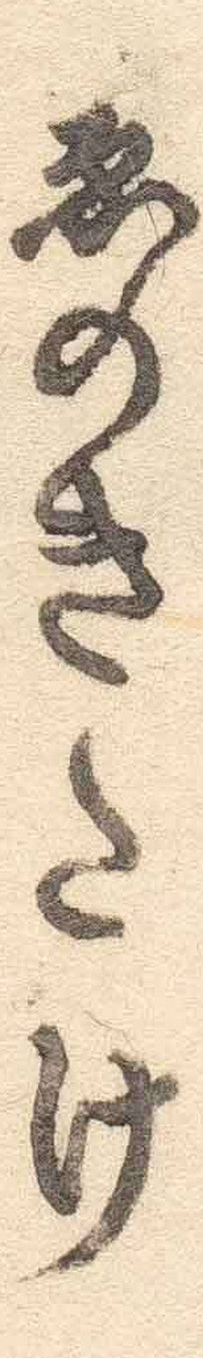ゑのきたけ
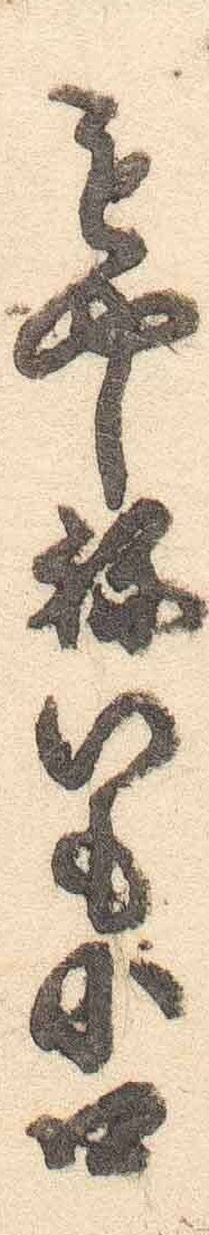もやしねいも小口
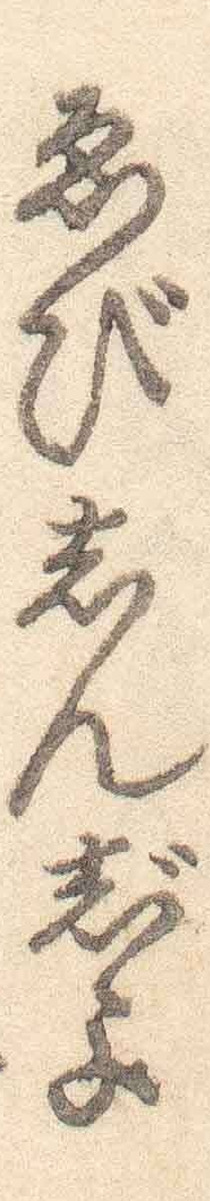ゑびしんじよ
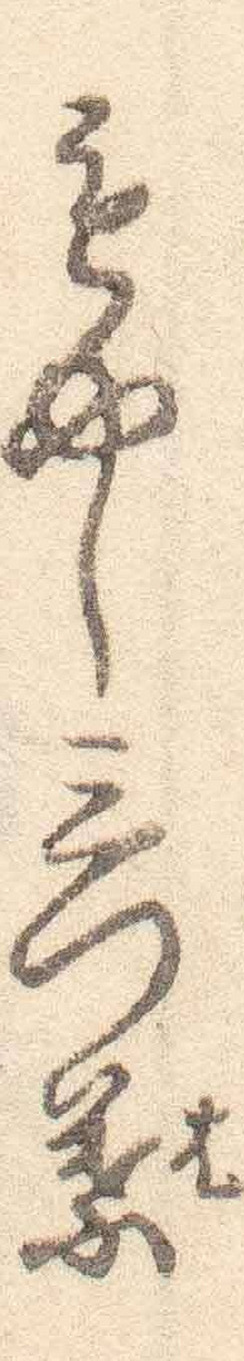もやし三つ葉
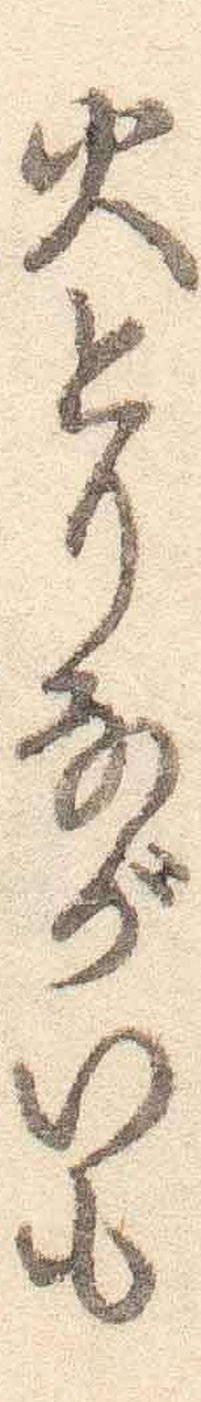火とりながいも
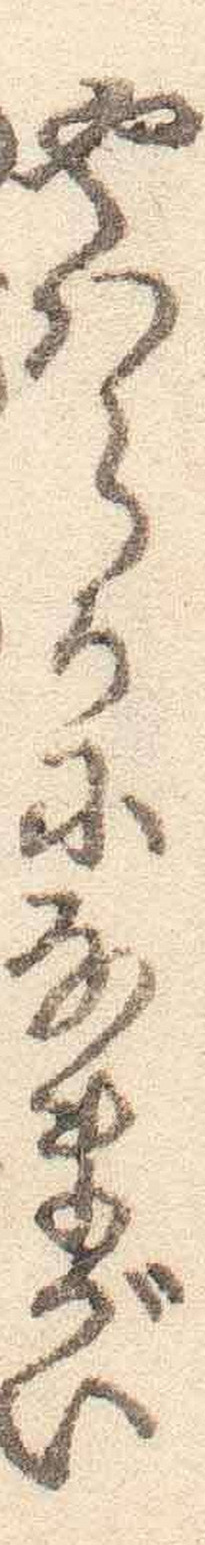やはらかになまがい
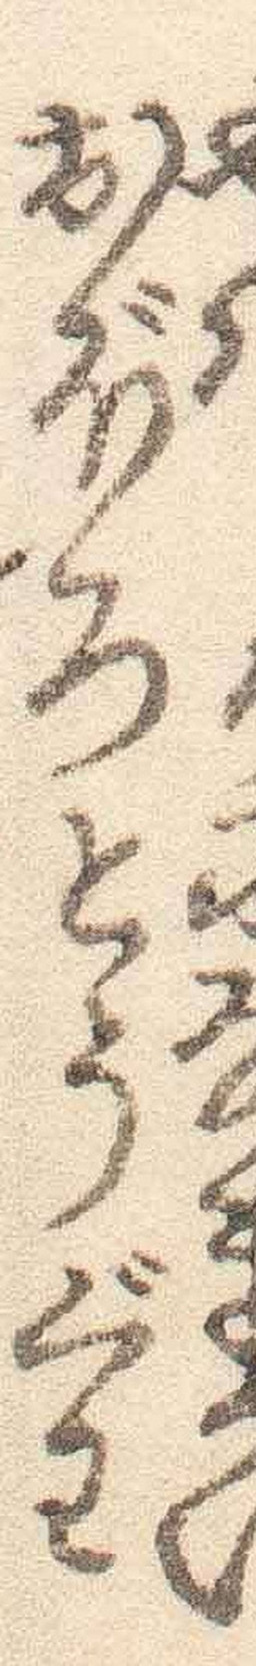おぼろとうぐわ
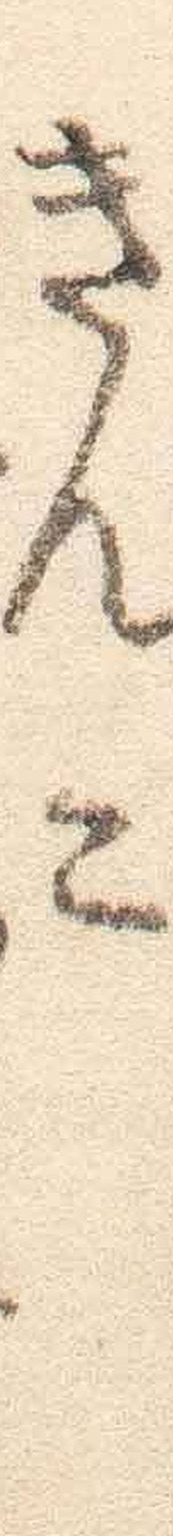きんこ
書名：料理通
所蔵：東京学芸大学附属図書館 国文学研究資料館
